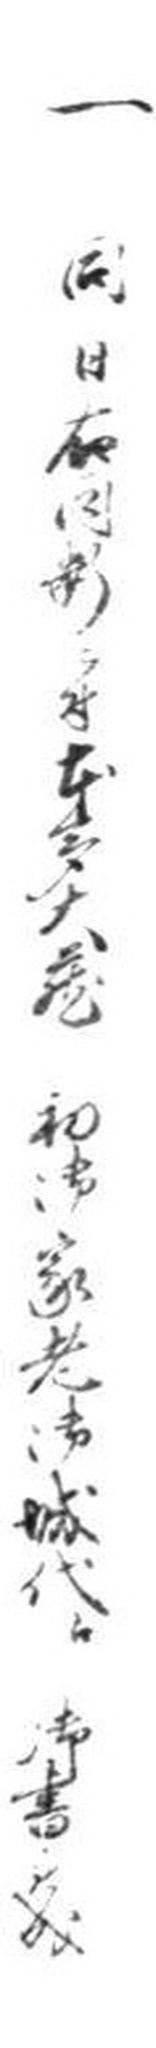一同日右同断ニ付本多大蔵初御家老御城代江御書被成
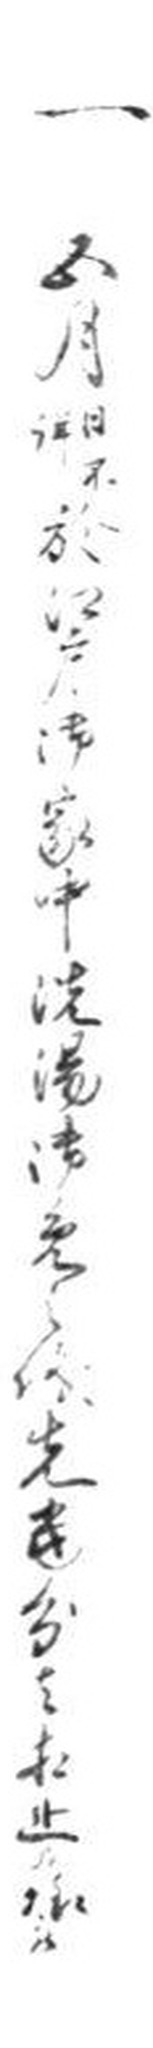一五月日不詳於江戸御家中洗湯御免之儀先当分者相止候様被
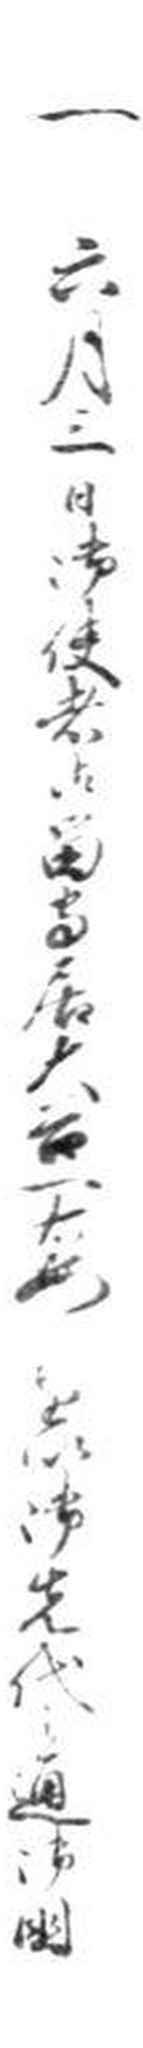一六月三日御使者御留守居大谷一右衛門を以御先代之通御国
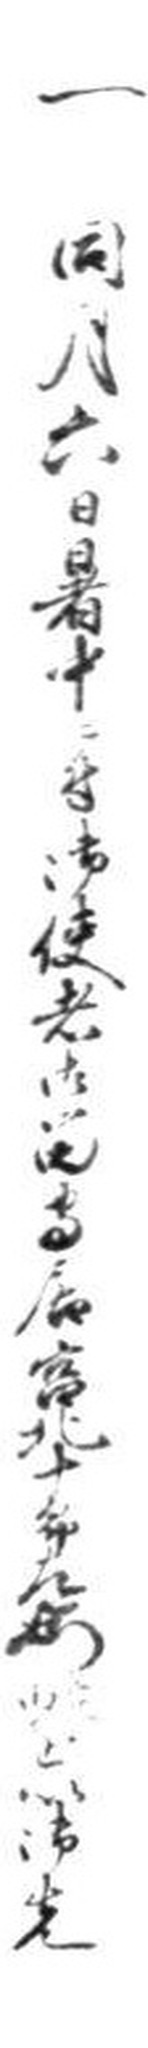一同月六日暑中ニ付御使者御留守居宮北十郎左衛門定由を以御先
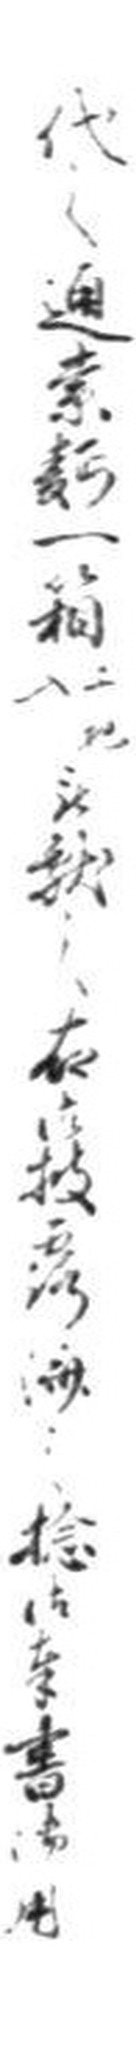代之通素麪一箱千把入被献之右御披露済之捻御奉書御用
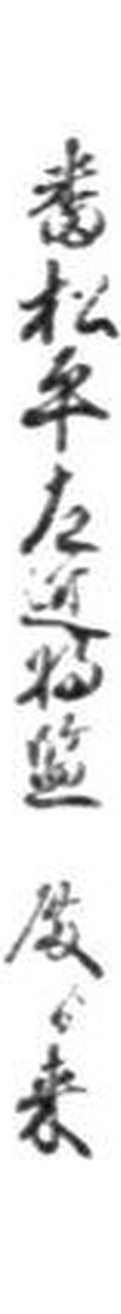番松平左近将監殿ゟ来
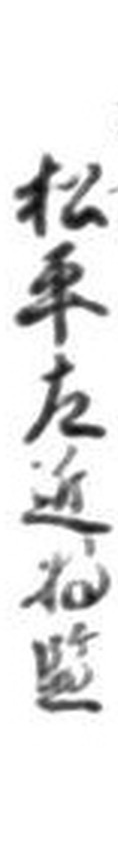松平左近将監
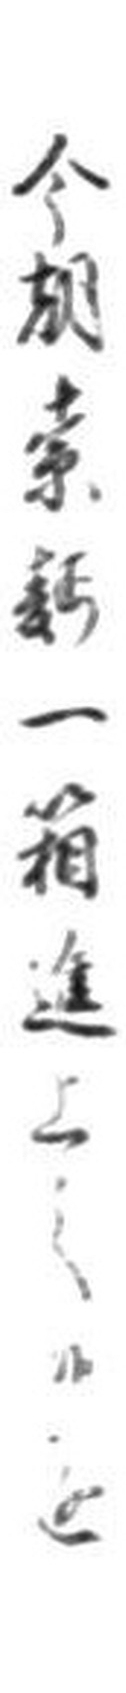今朝素麪一箱進上之候遂
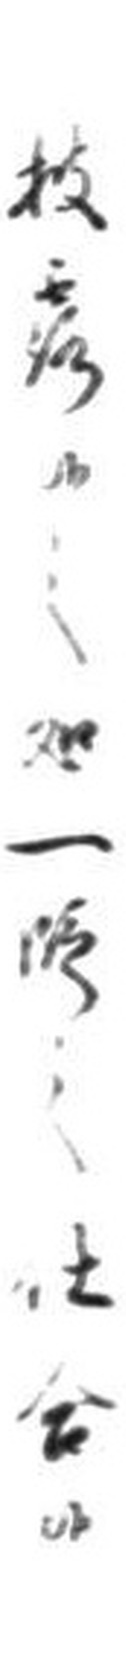披露候之処一段之仕合候
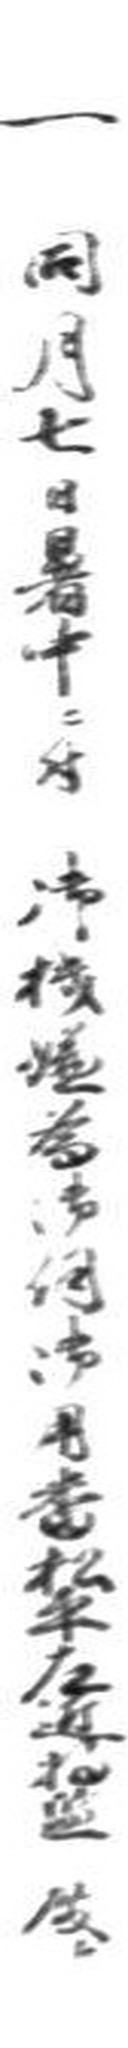一同月七日暑中ニ付御機嫌為御伺御用番松平左近将監殿江
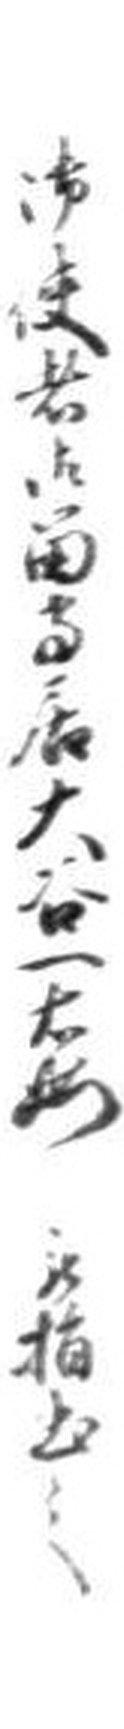御使者御留守居大谷一右衛門被指出之

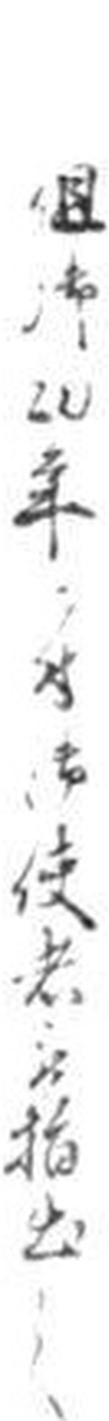但御幼年ニ付御使者被指出之
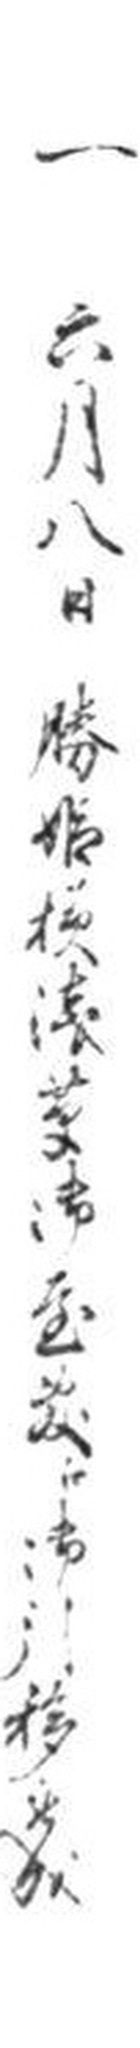一六月八日勝姫様浅草御屋敷江御引移被成
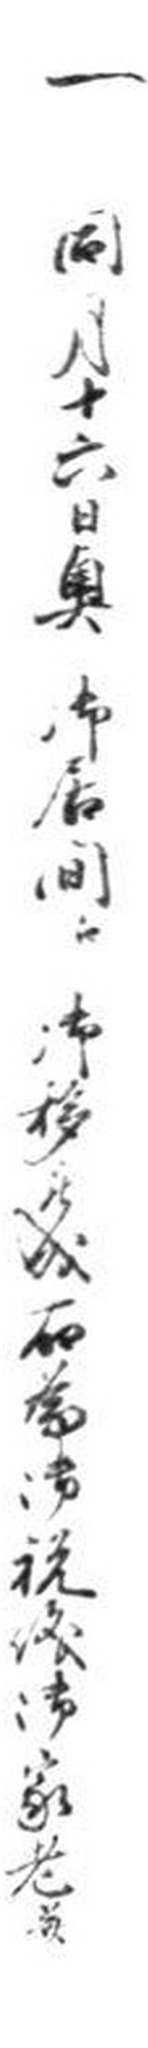一同月十六日奥御居間江御移被成右為御祝儀御家老并
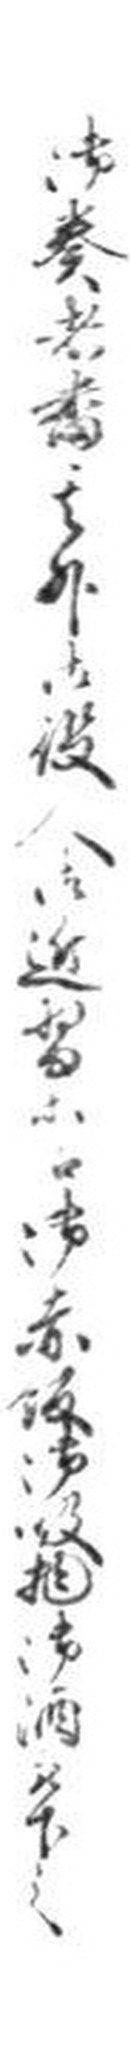御奏者番其外御役人御近習等江御赤飯御吸物御酒被下之
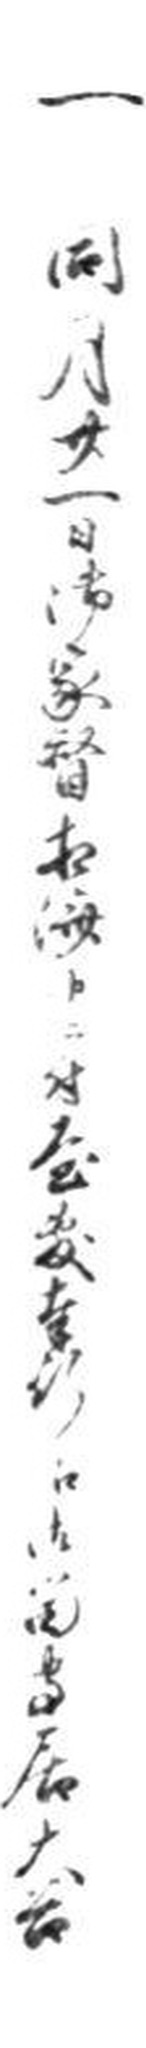一同月廿一日御家督相済候ニ付屋敷奉行江御留守居大谷
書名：家譜 三十八 宗矩公 従享保九年五月到享保九年十二月
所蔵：福井県文書館 Fukui Prefectural Archives
